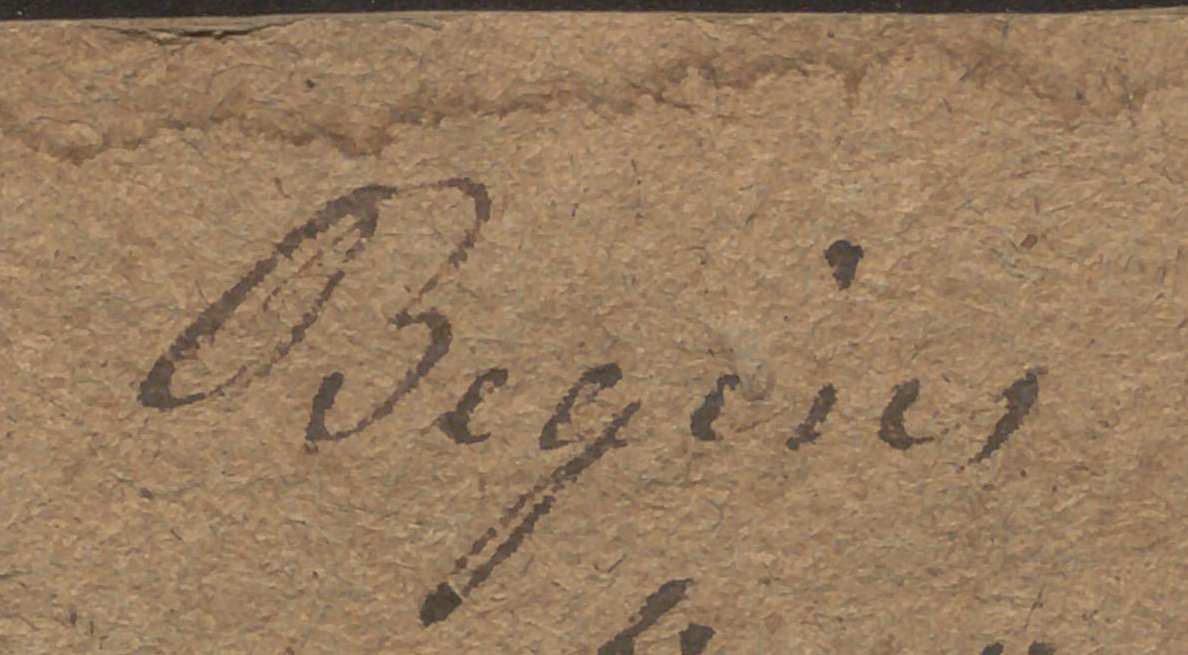Begins
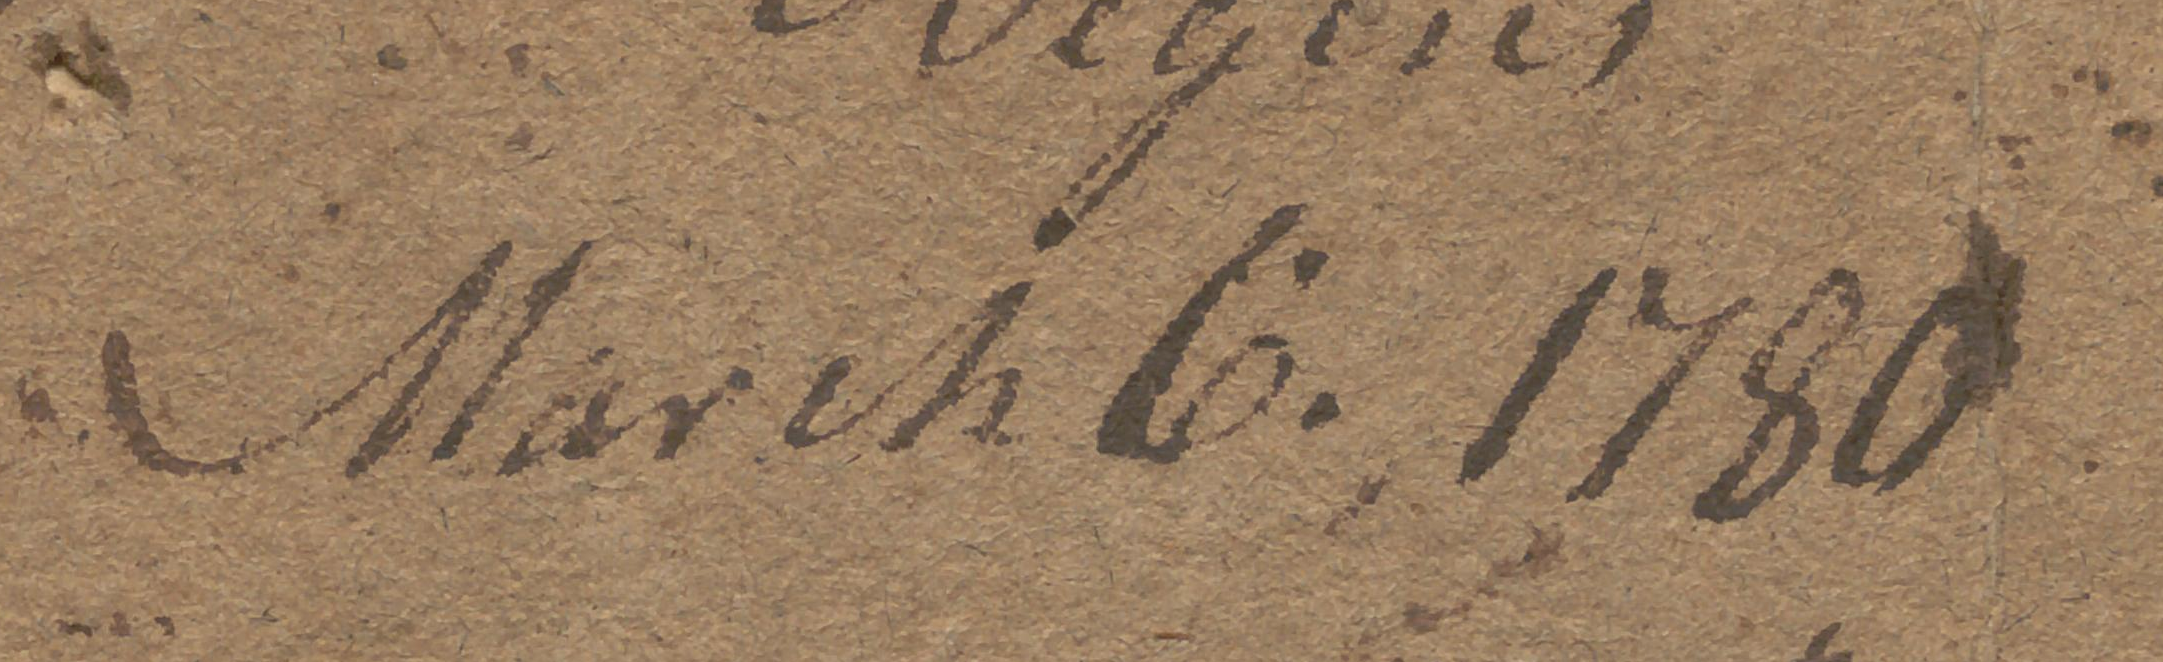March 6. 1780
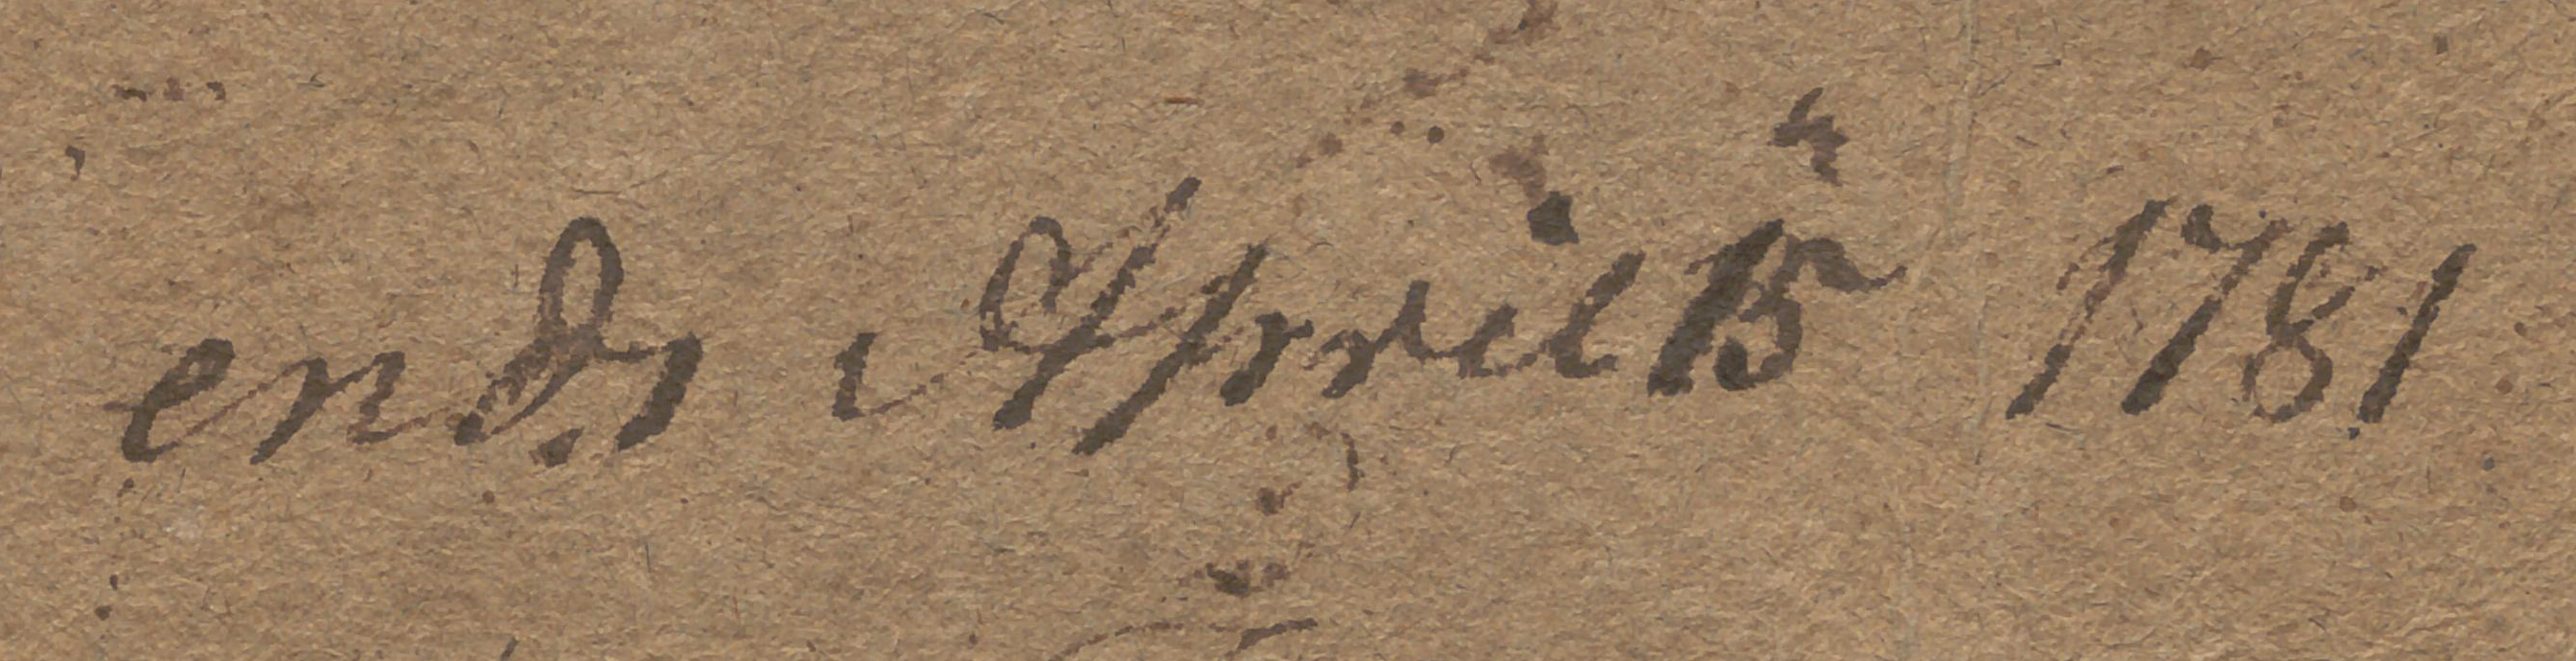ends April 1781
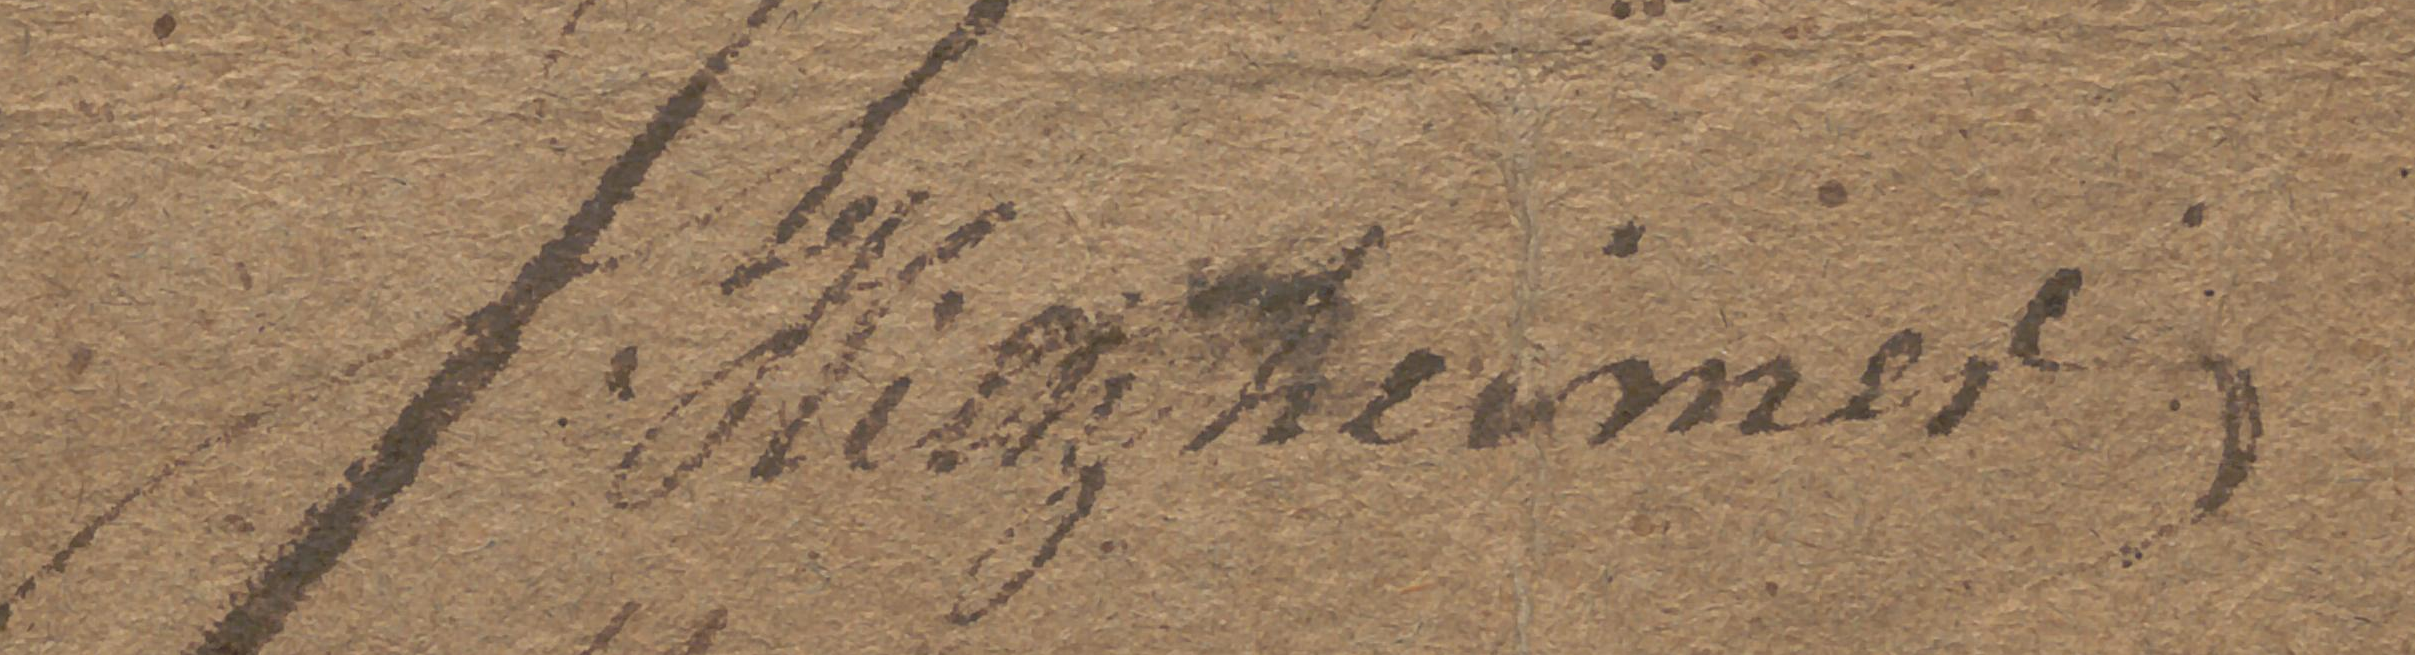J Hiltzheimer
